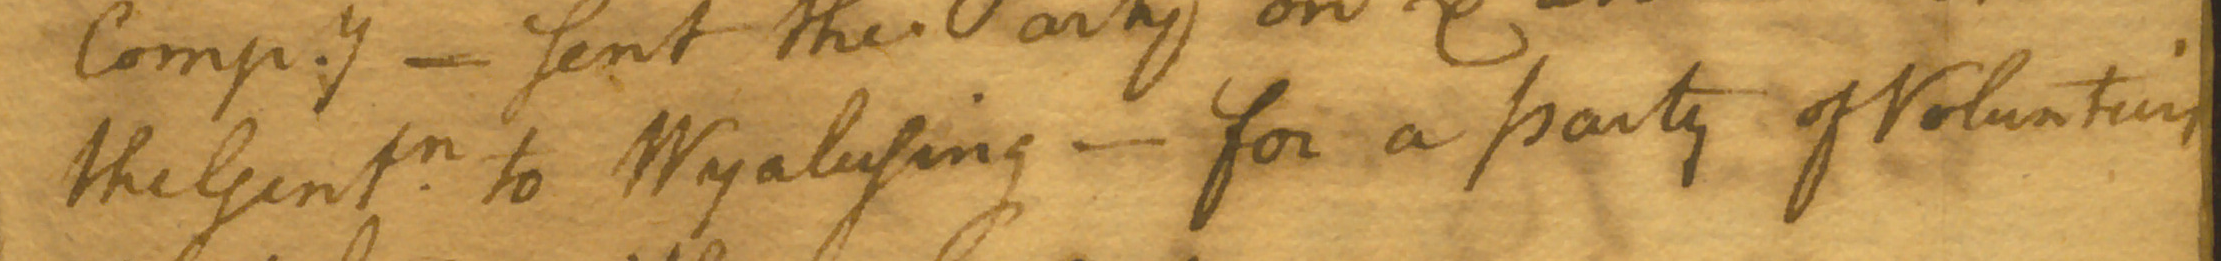the Gent^n. to Wyalusing- for a party of Volunteer's
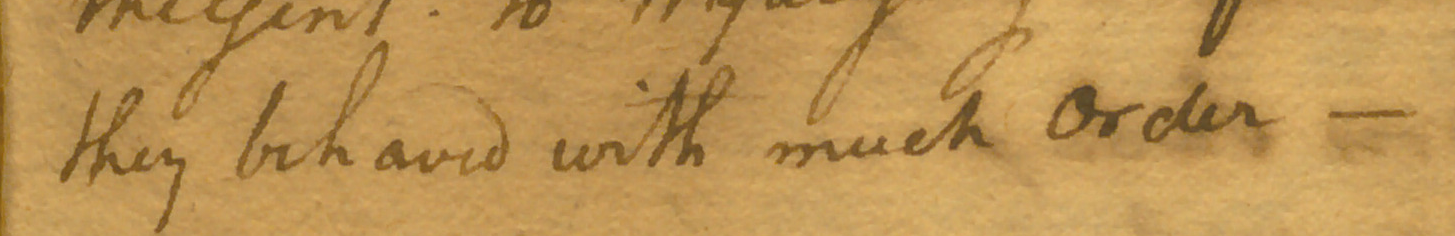they behaved with much order-
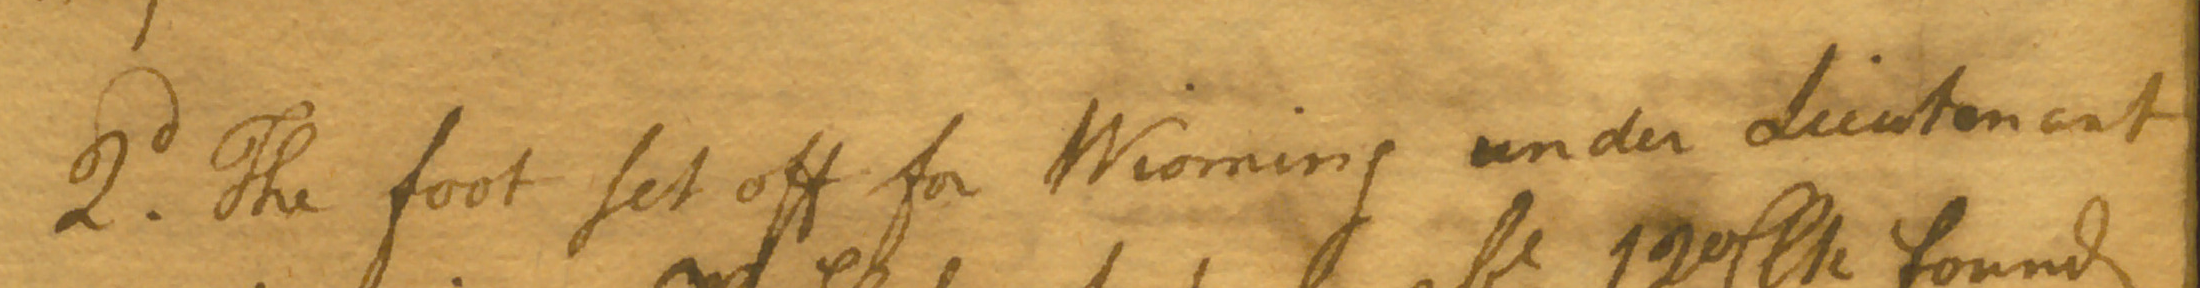2^d. The foot set off for Wioming under Lieutenant
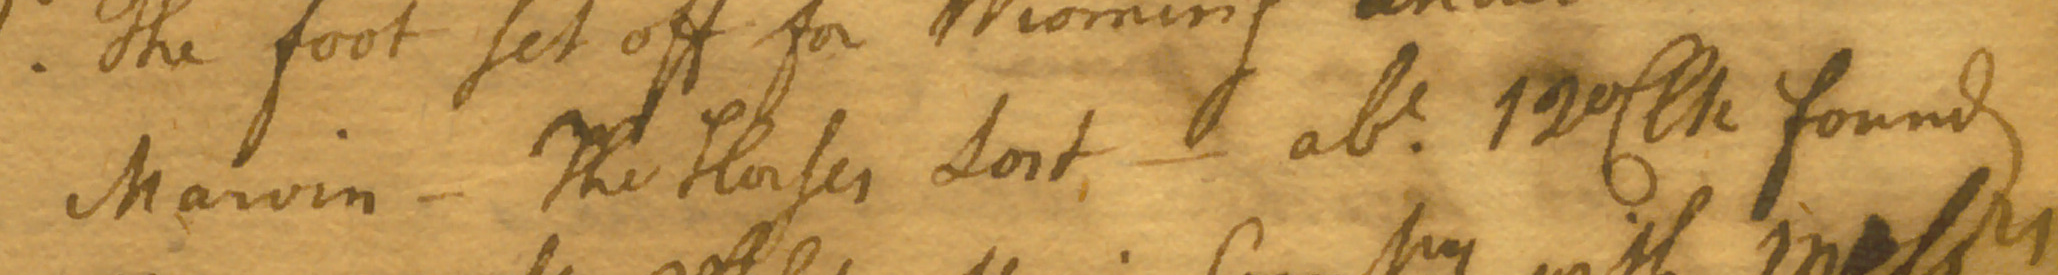Marvin- The Horses Lost- ab^t. 12 ^oClk found
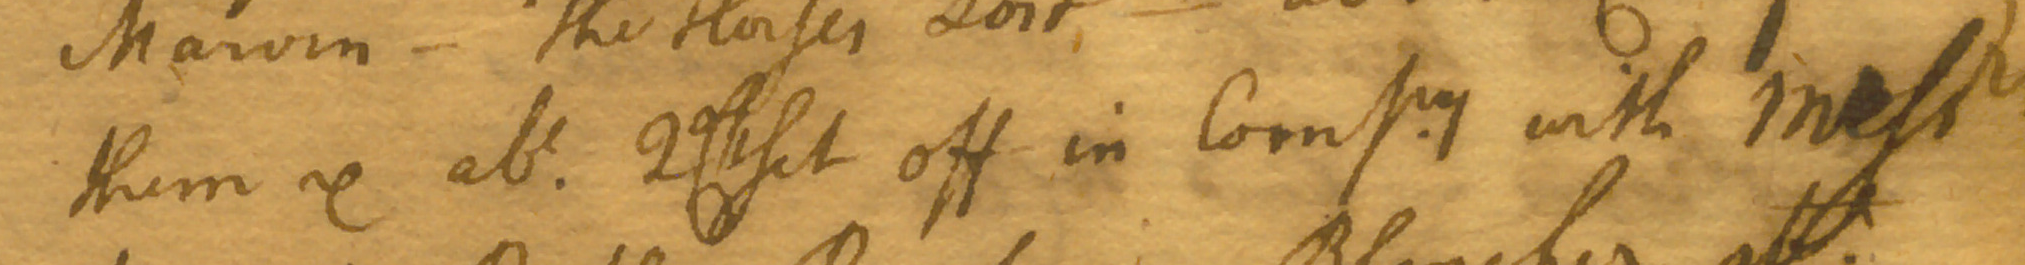them & ab^t 2 ^oClk set off in Comp^y. with Mess
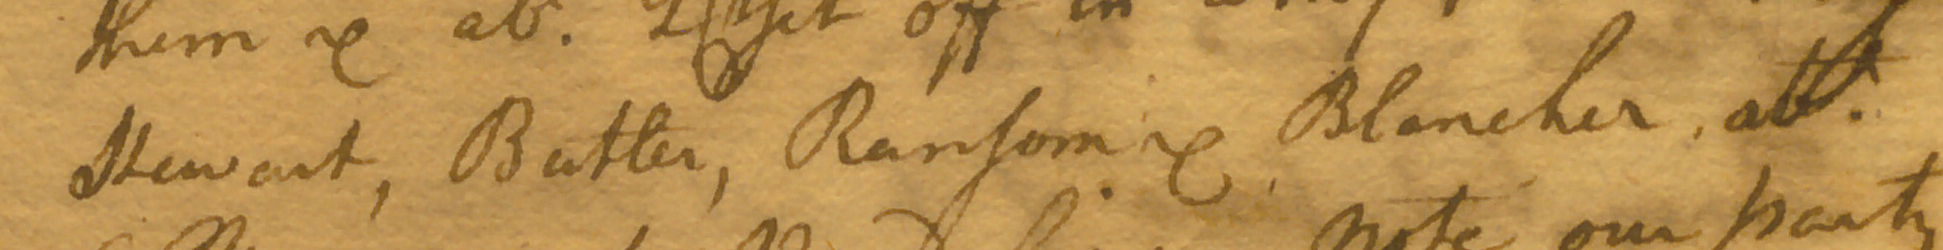Stewart, Butler, Ransom & Blancher ab^t.
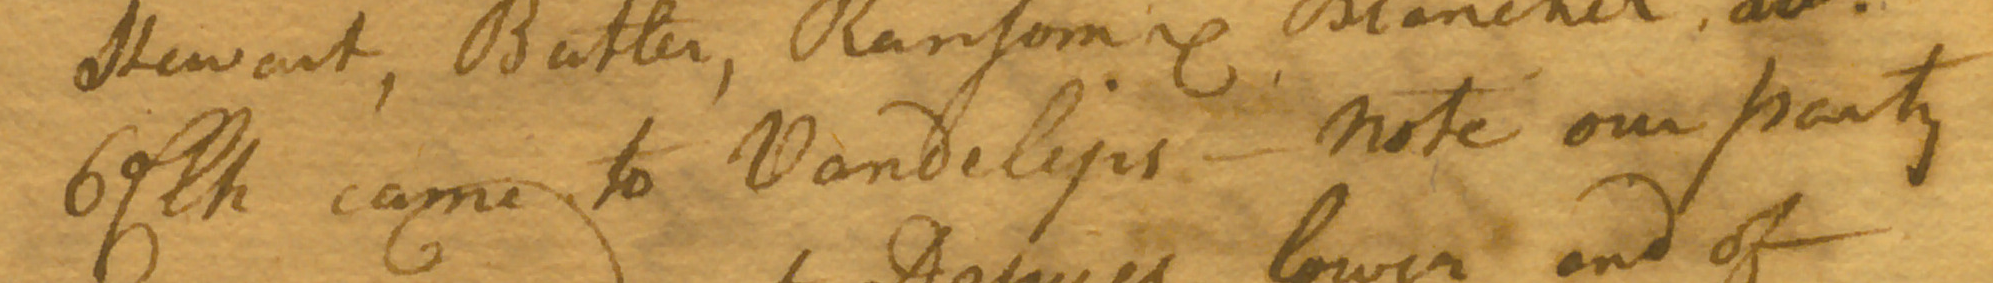6 ^oClk came to Vandelips- note our party
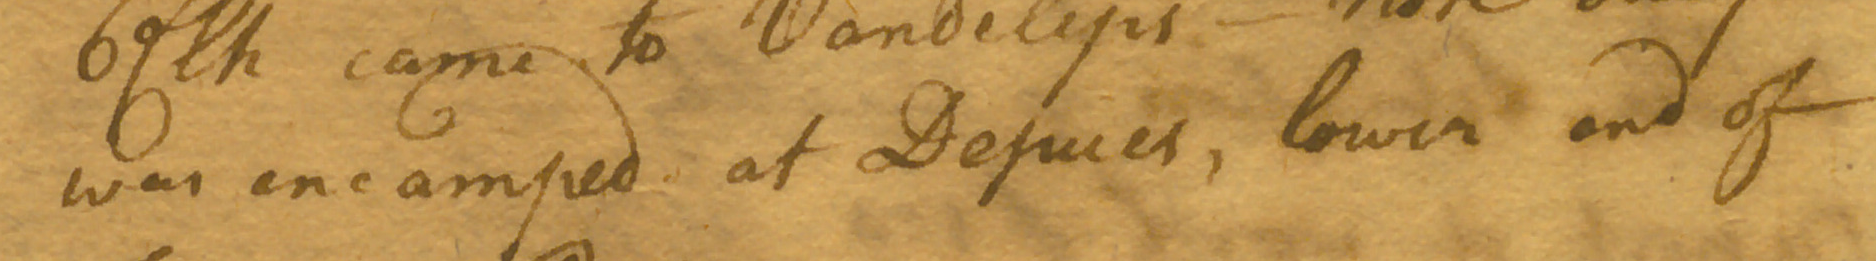was encamped at Depues, lower end of
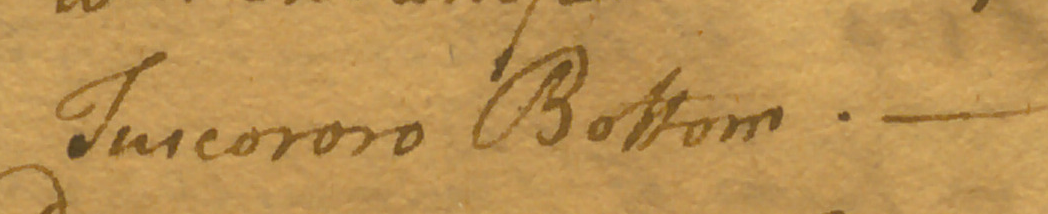Tuscororo Bottom.-
